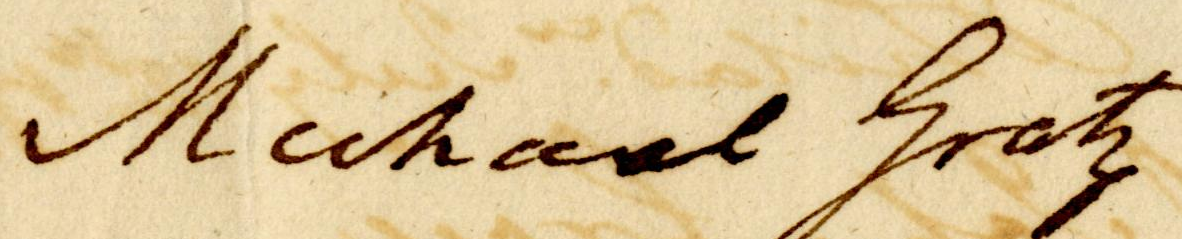Michael Gratz
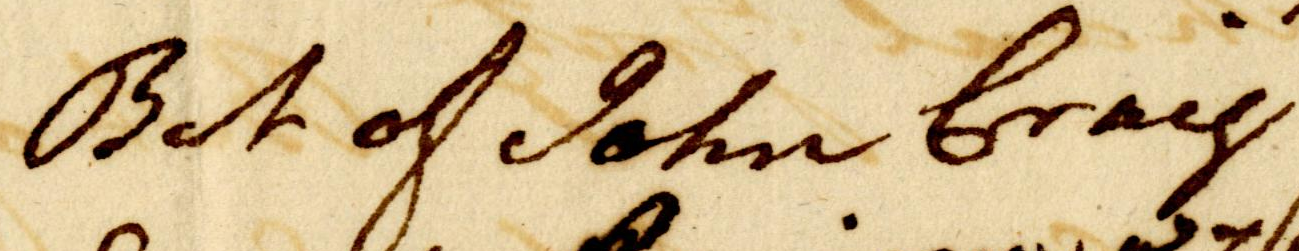Bot of John Gray
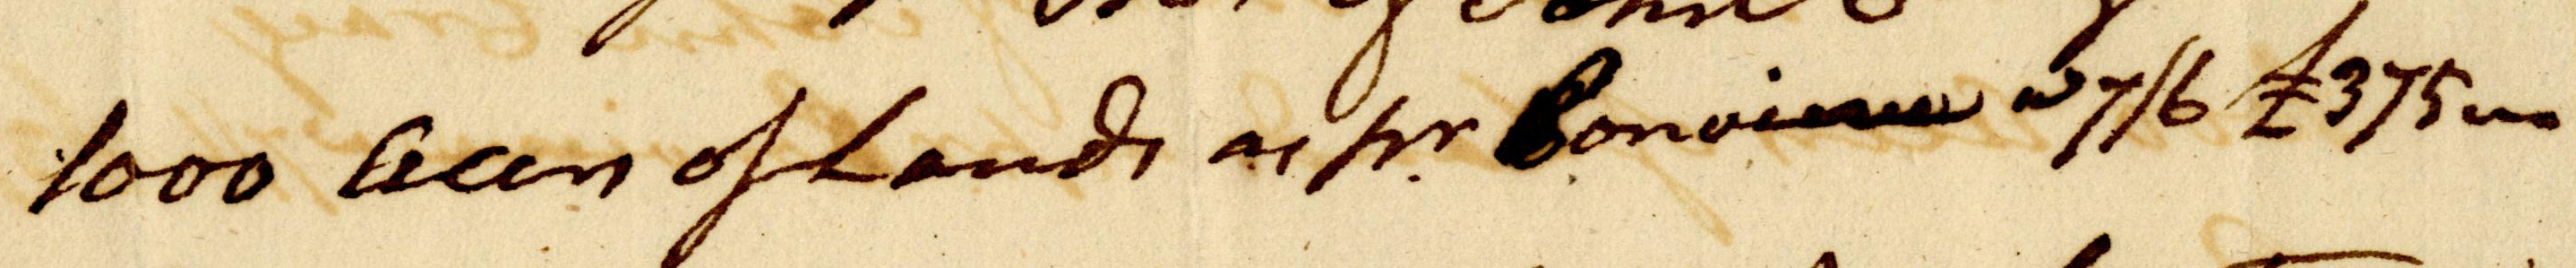1000 acres of Lands as p^r Convince 7/6 £375-
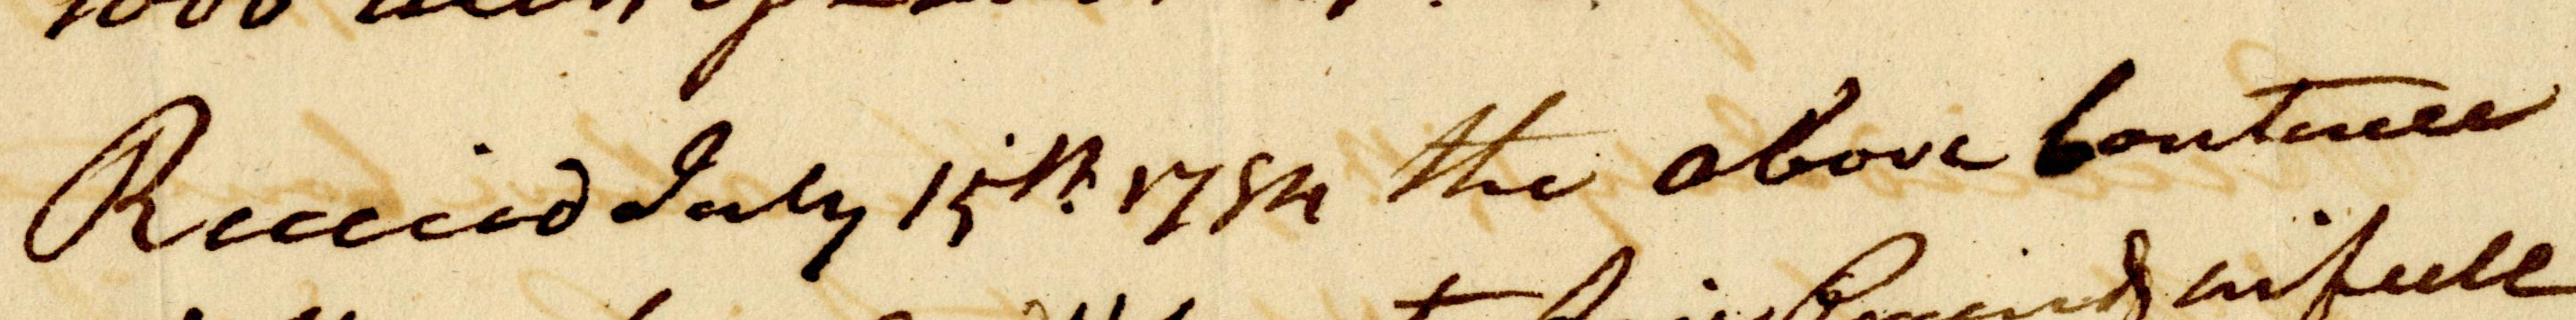Received July 15^th 1784 the above Contace
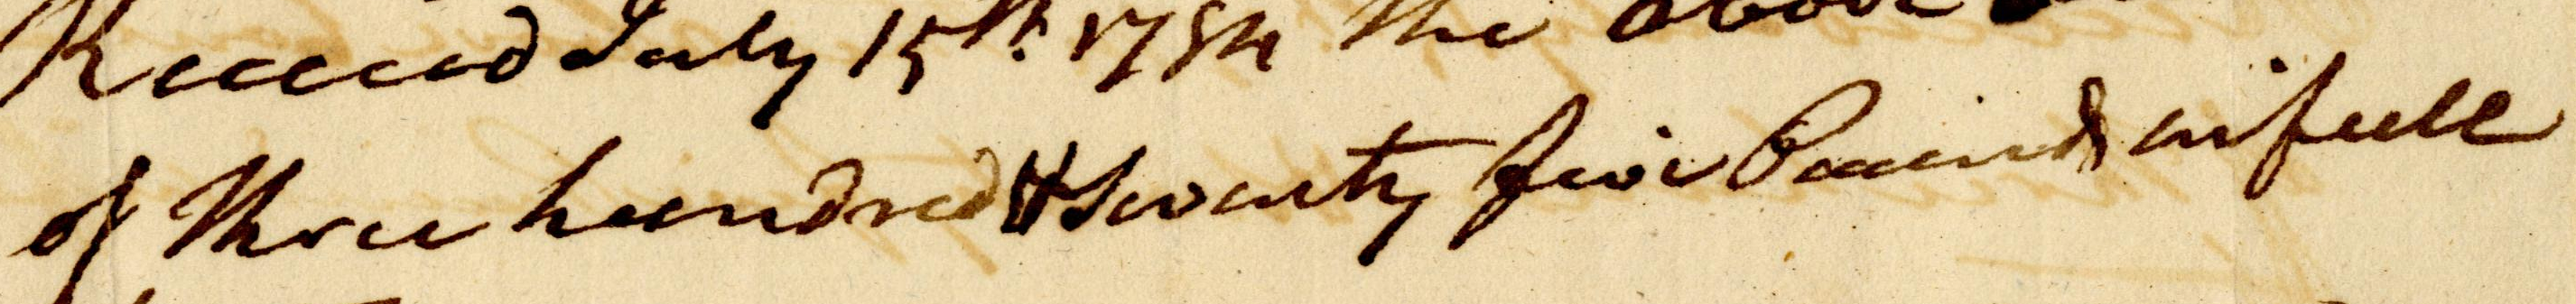of three hundred & seventy five pounds in full
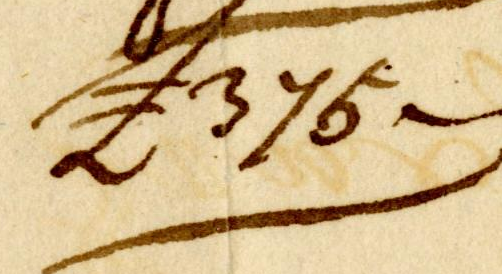£375-
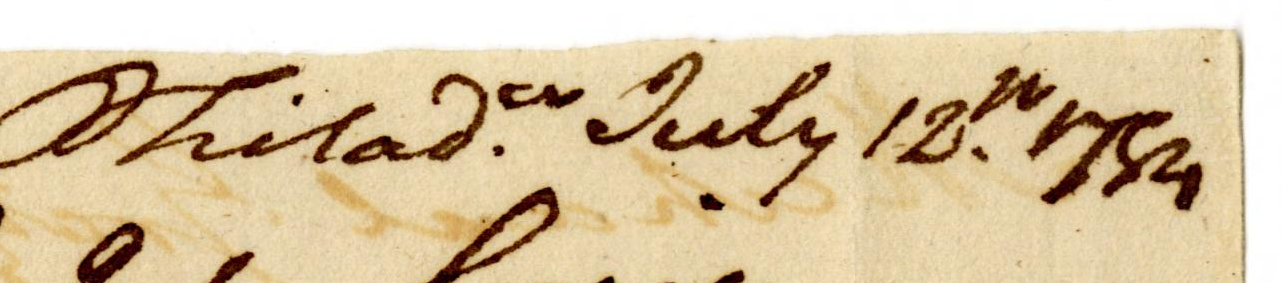Philad^a. July 12^th. 1784
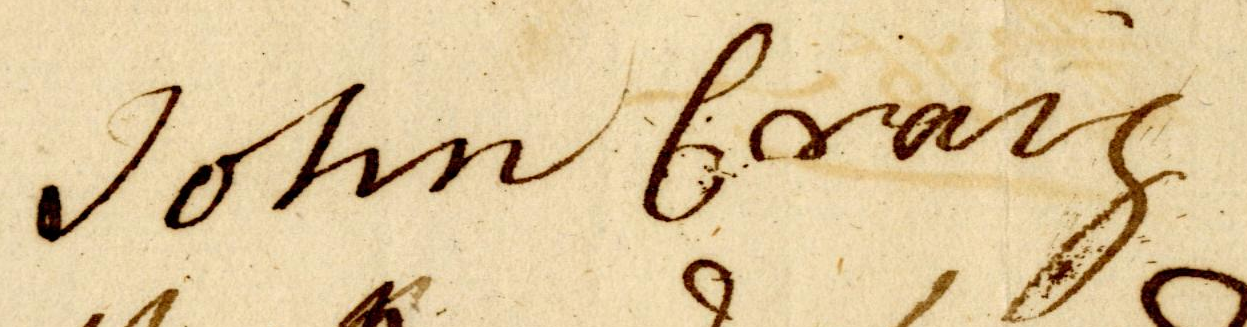John Craig
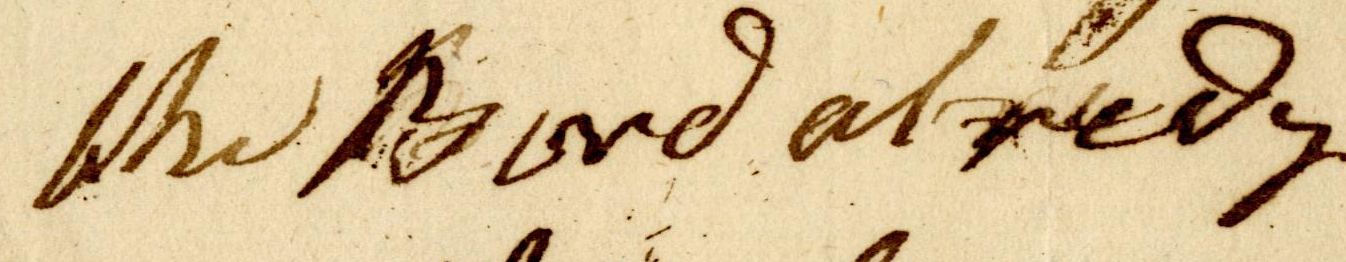The bond at redy
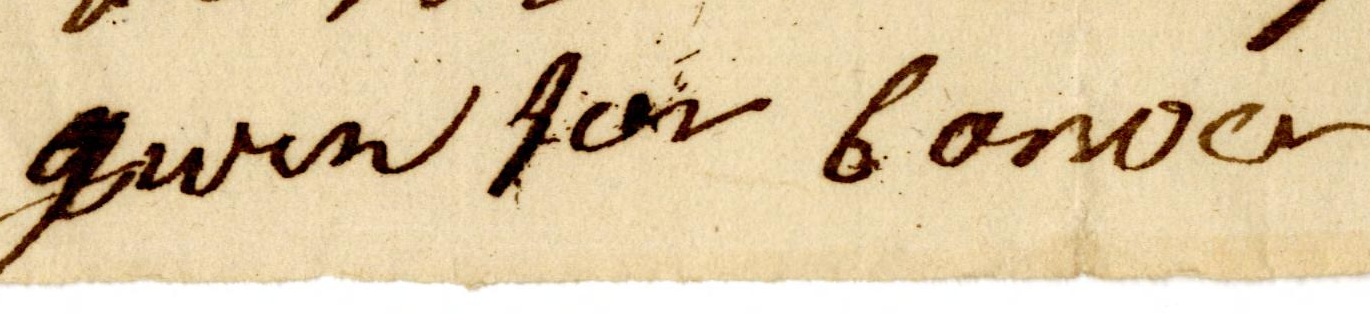given for carver
